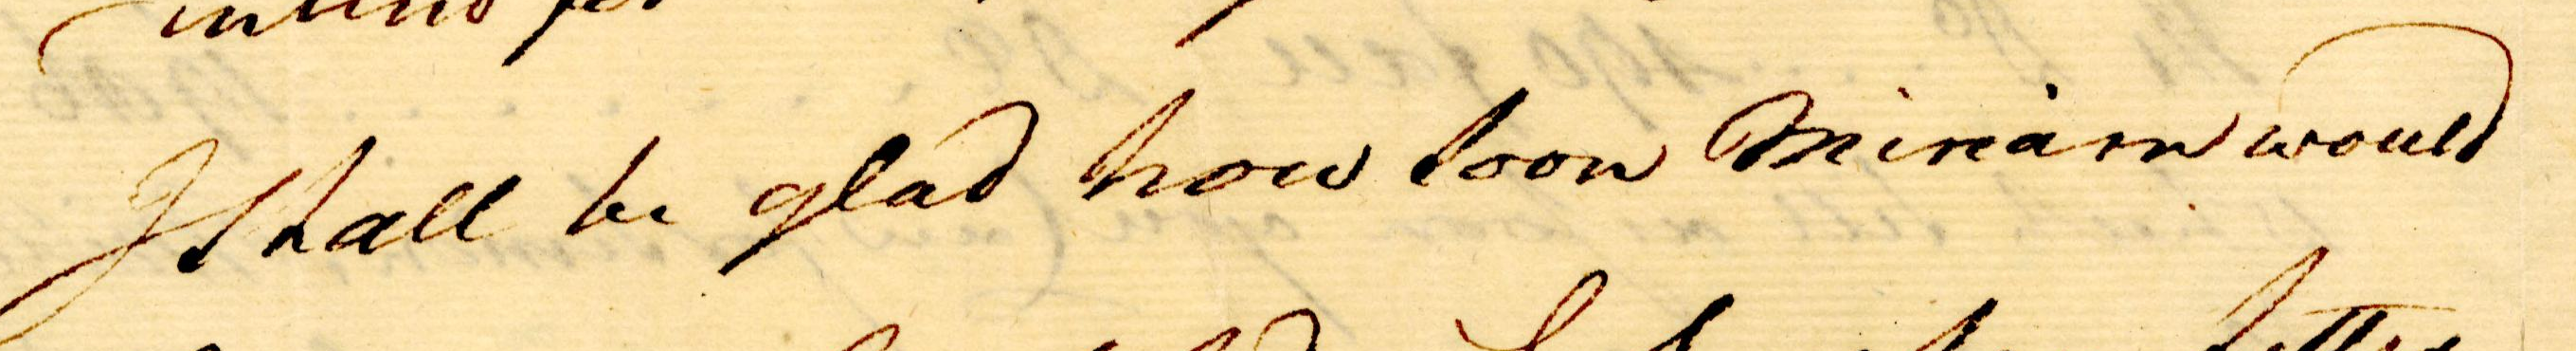I shall be glad how soon Miriam would
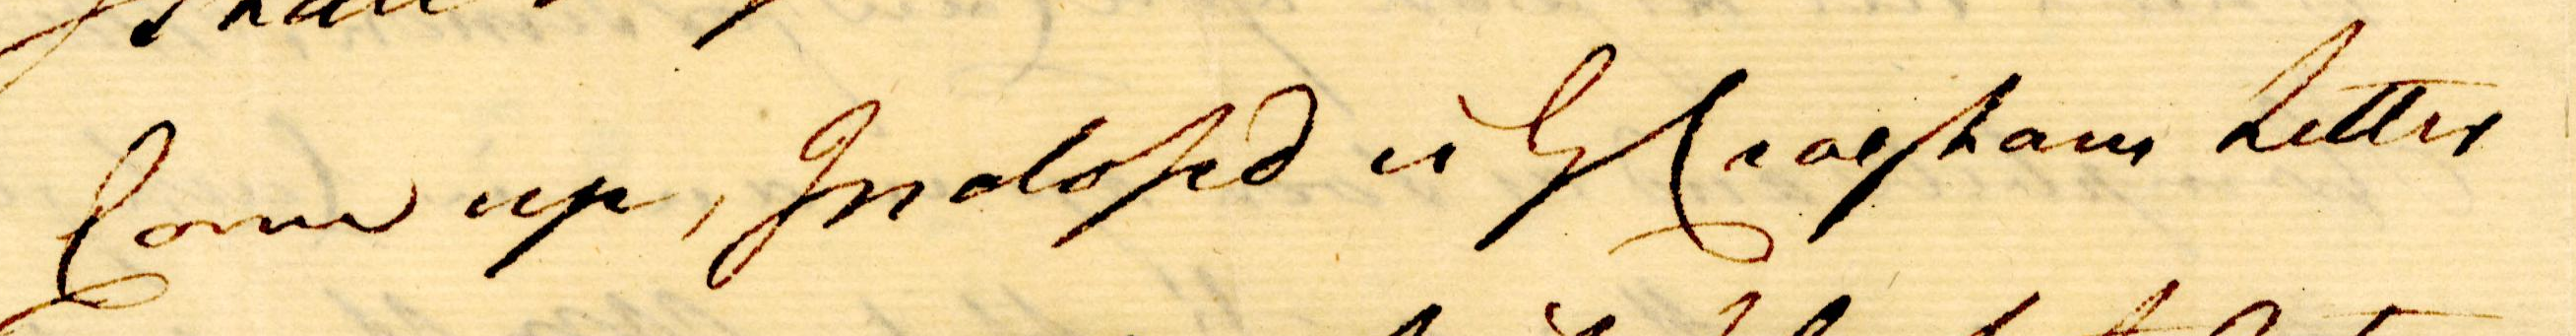Come up, Inclosed is G Croghans letter
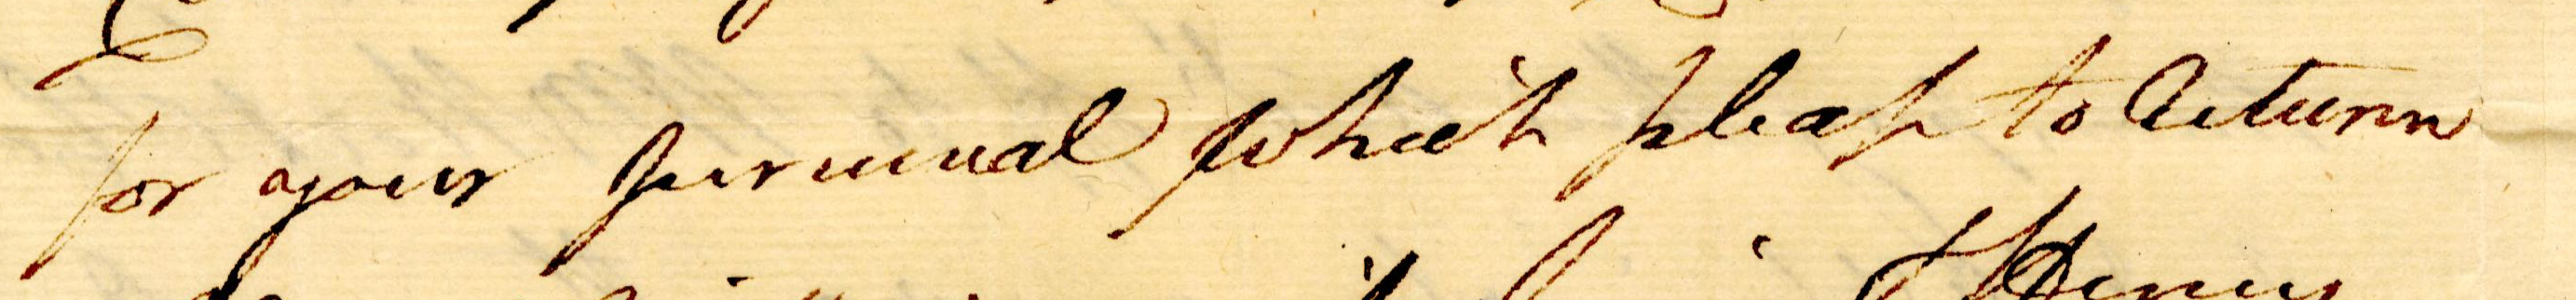for your perusual which please to return
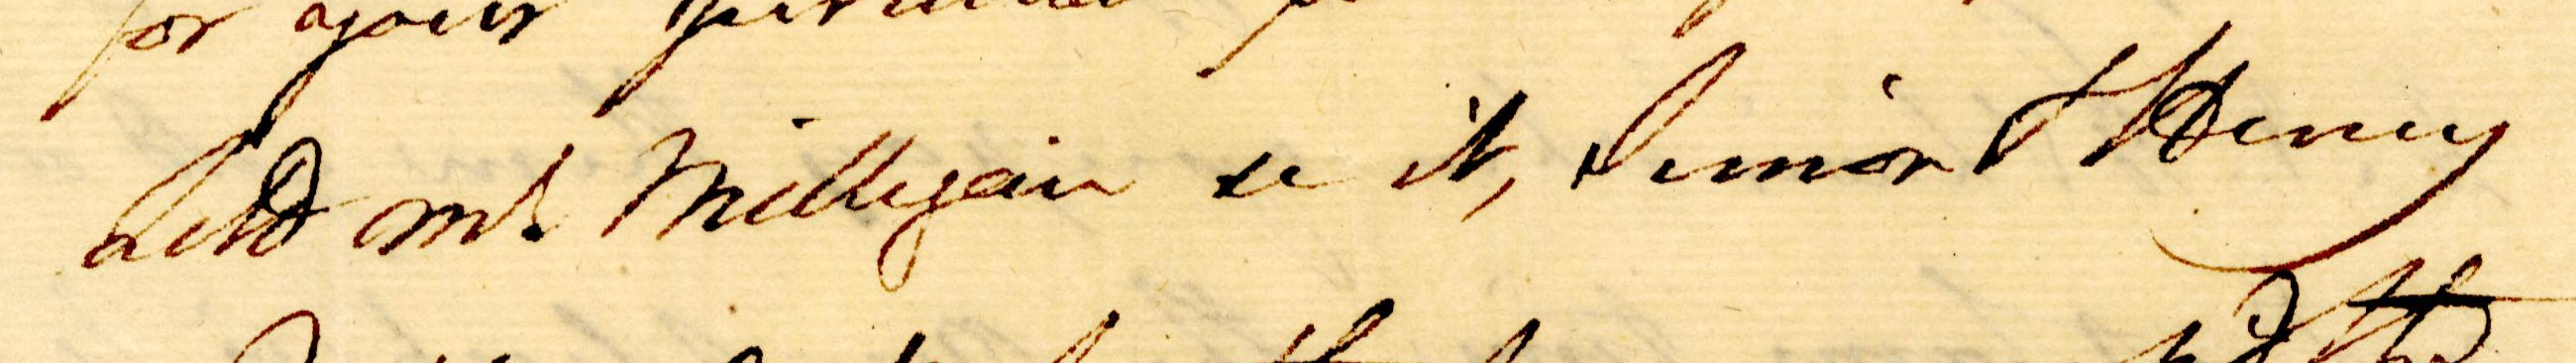Letd m^r Milligan se it, Simon & Henry
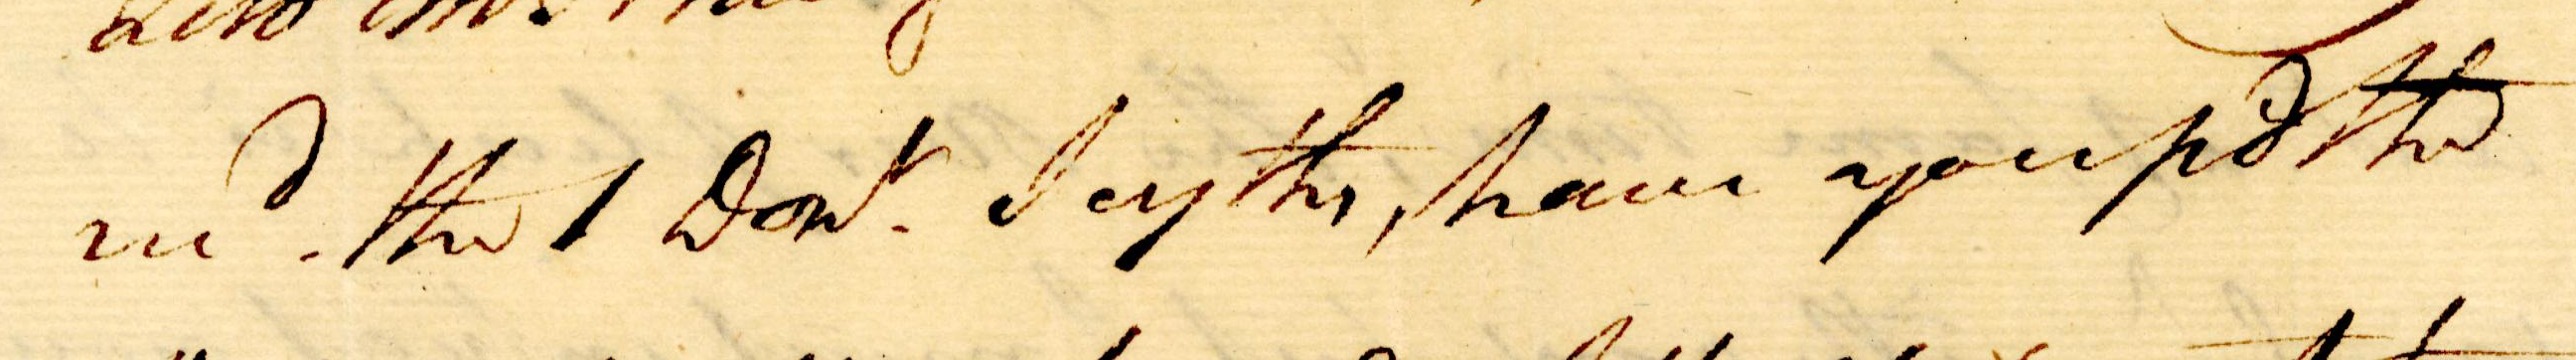rec^d. the 1 Don^t. Scyths, have you pd the
